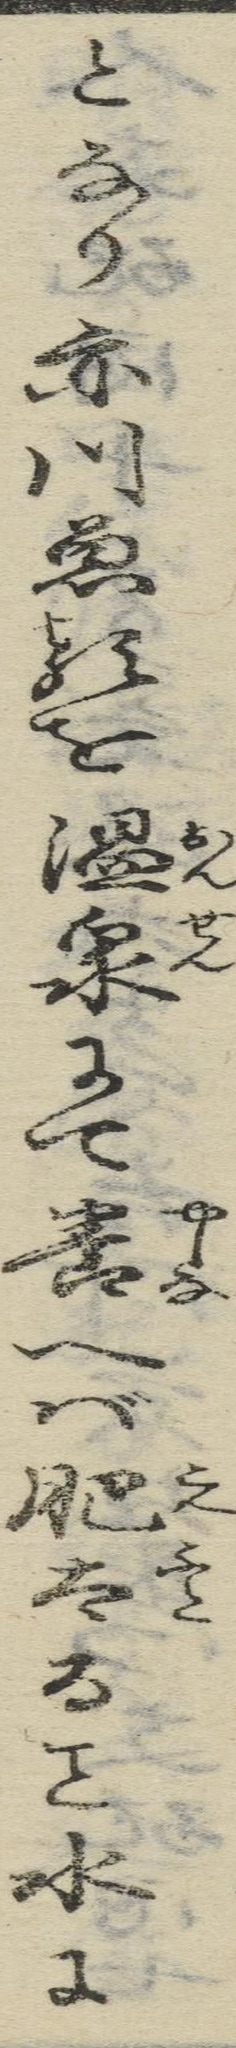となり亦川魚類を温泉にて養へば肥太るを水に
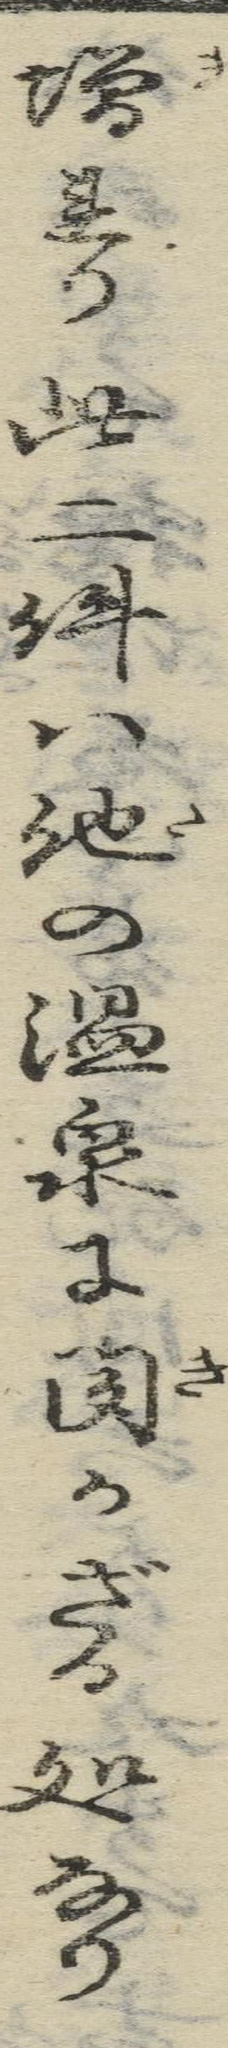増れり此二件は他の温泉聞かざる処なり
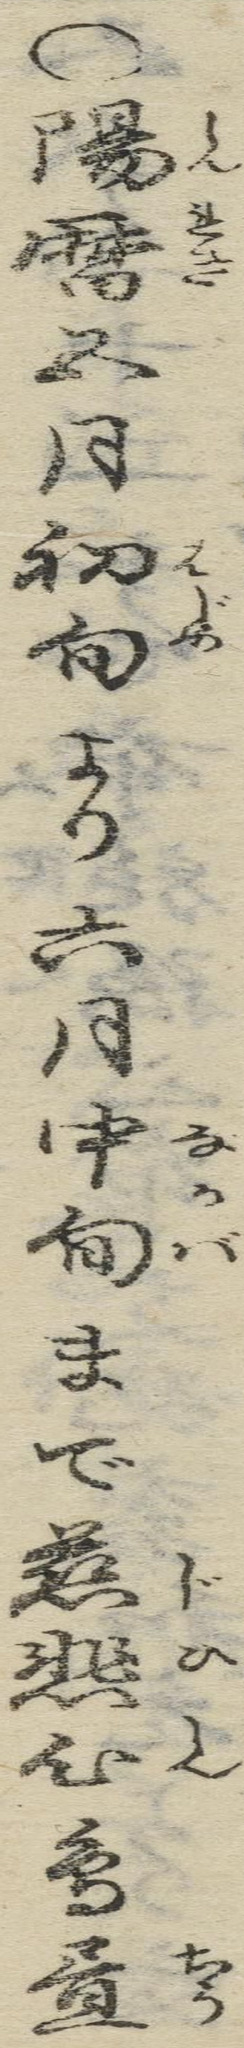○陽暦五月初旬より六月中旬まで慈悲心鳥昼
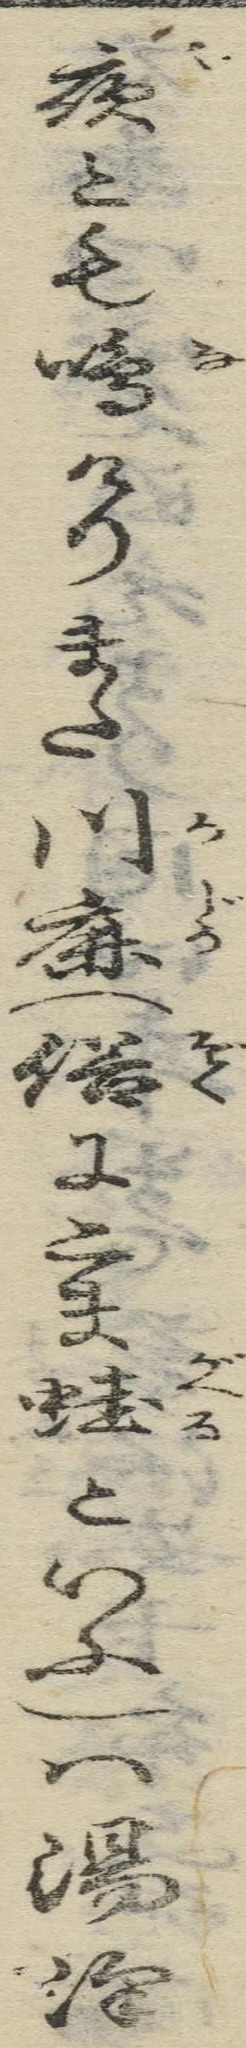夜とも鳴けりまた川鹿にこま蛙といふ）は湯澤
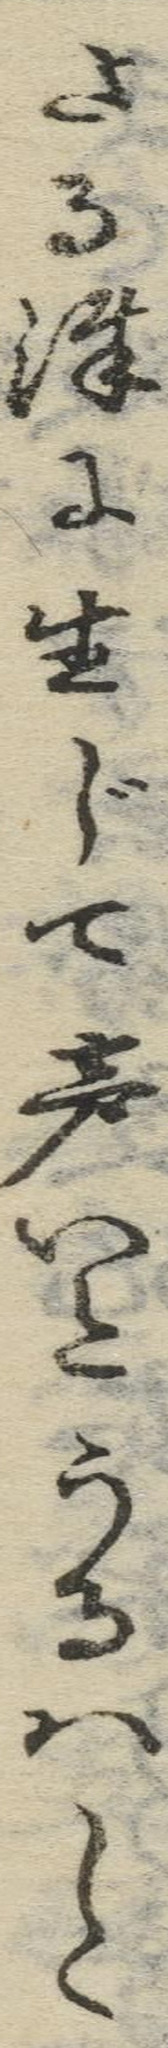さる津に生じて声いとうるはし
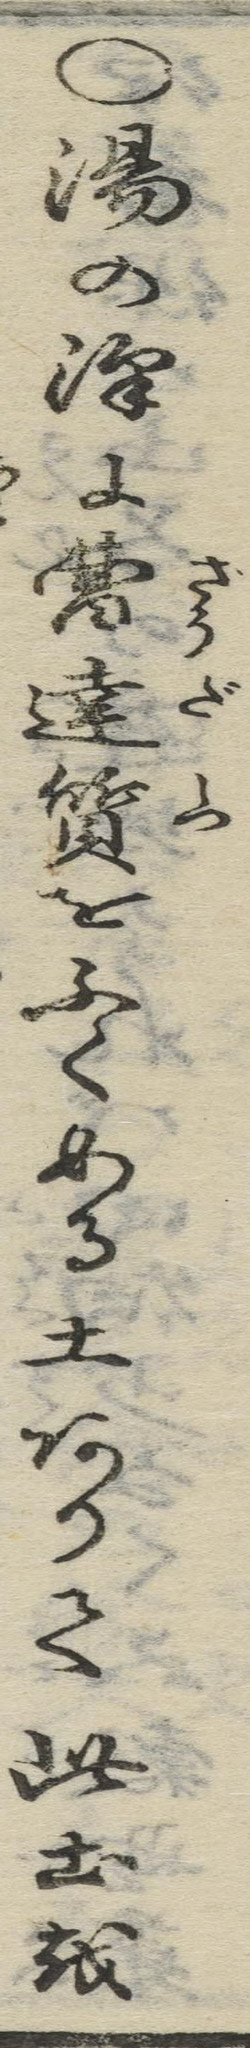○湯の澤に曹達質をふくめる土ありて此土を
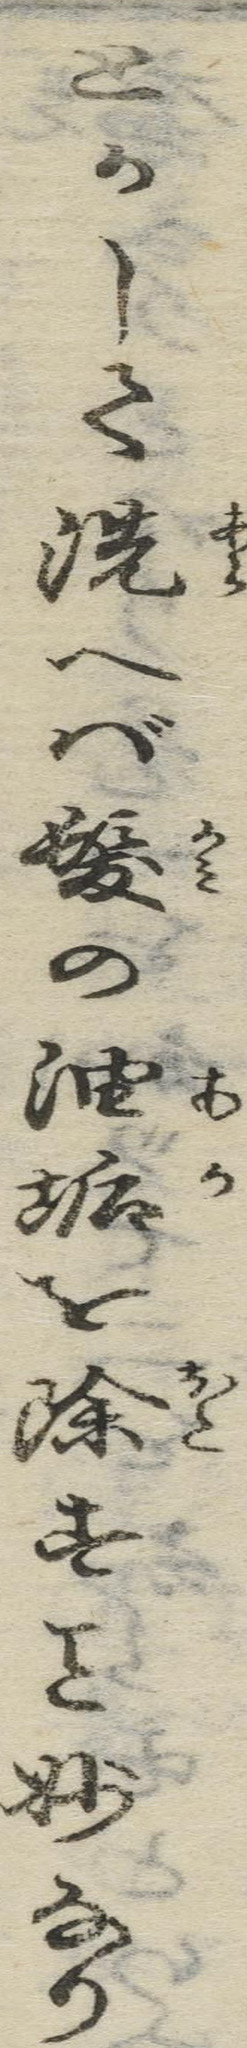とかして洗へば髪の油垢を除すこと妙なり
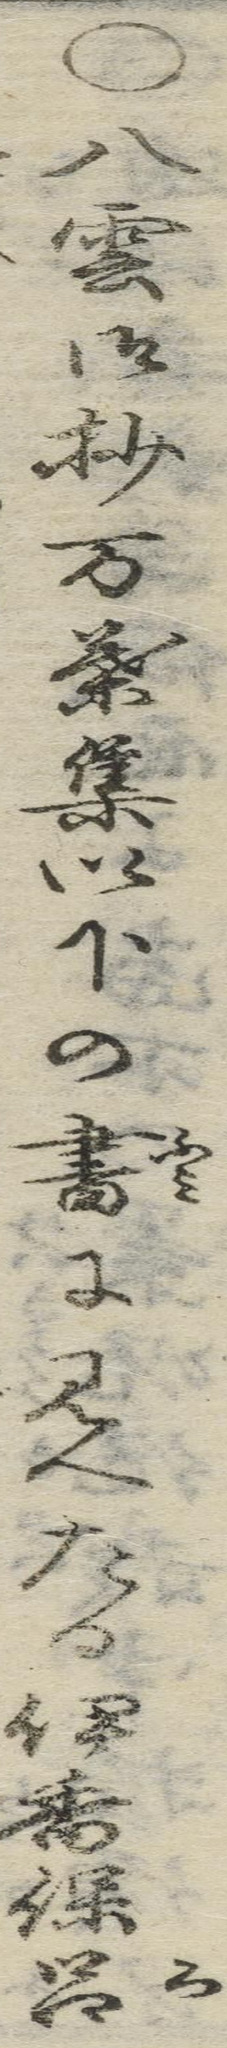○八雲御抄万葉集以下の書に見へたる伊香保呂
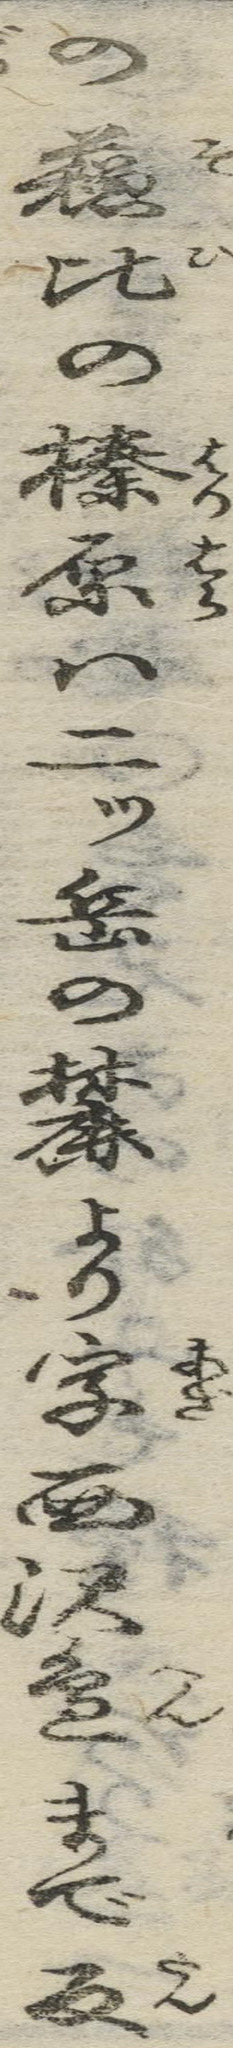の蘇比の榛原は二ッ岳の麓より字西沢邊まで反
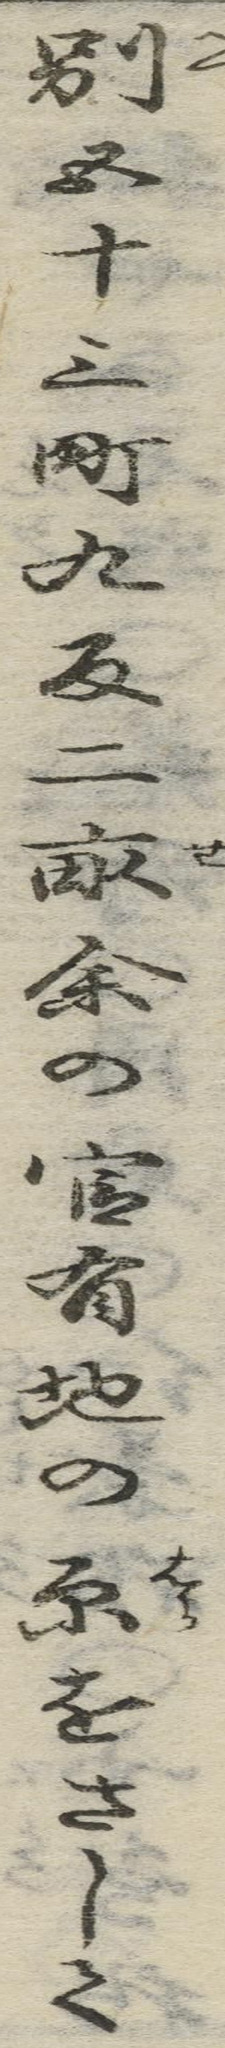別五十三町九反二畝余の官有地の原をさして
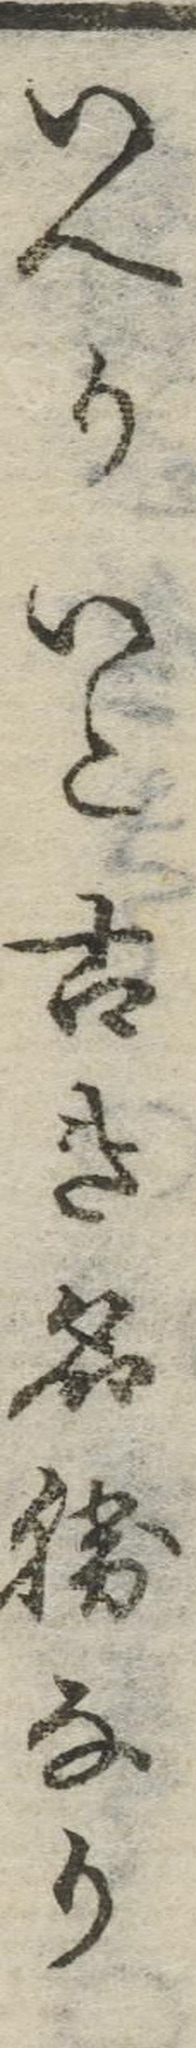いへりいと古き名勝なり
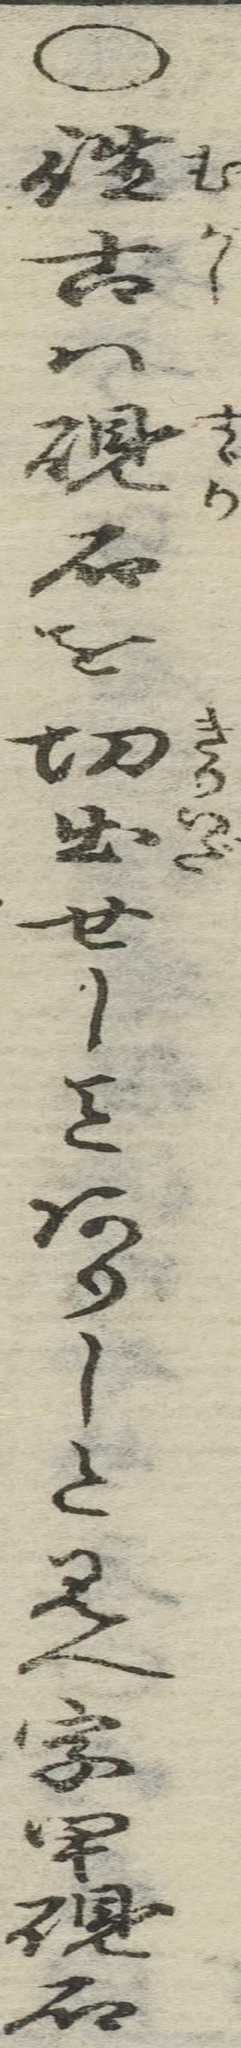○往古は硯石を切出せしことありしと見へ字甲硯石
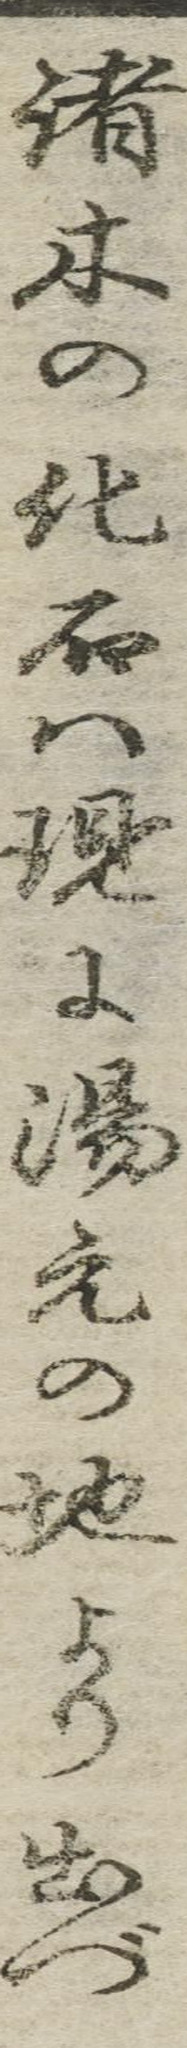諸木の化石は現に湯元の地より出づ
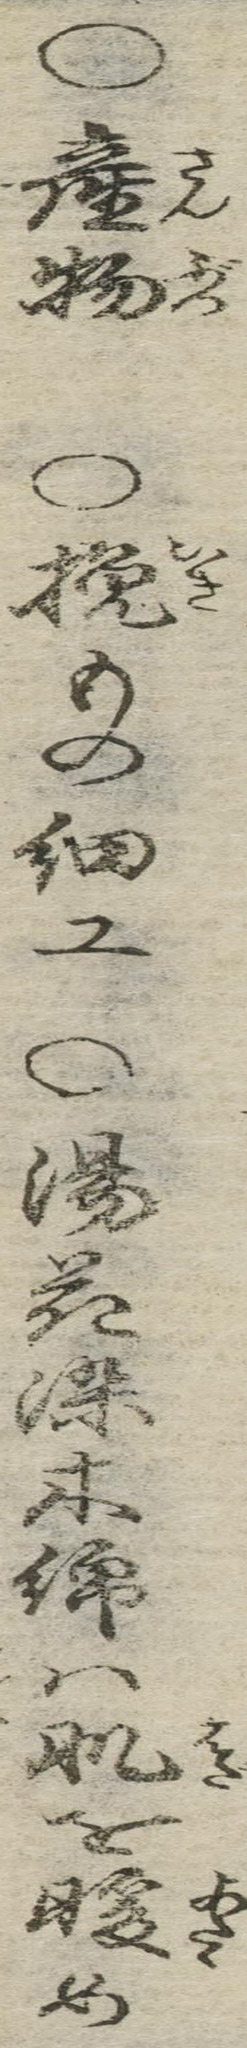○産物○挽もの細工○湯花染木綿は肌を暖め
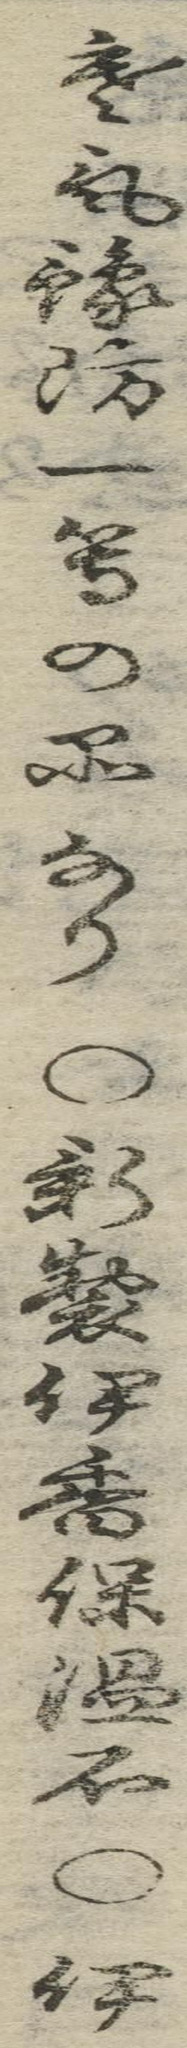寒気豫防一等の品なり○新製伊香保温石○伊

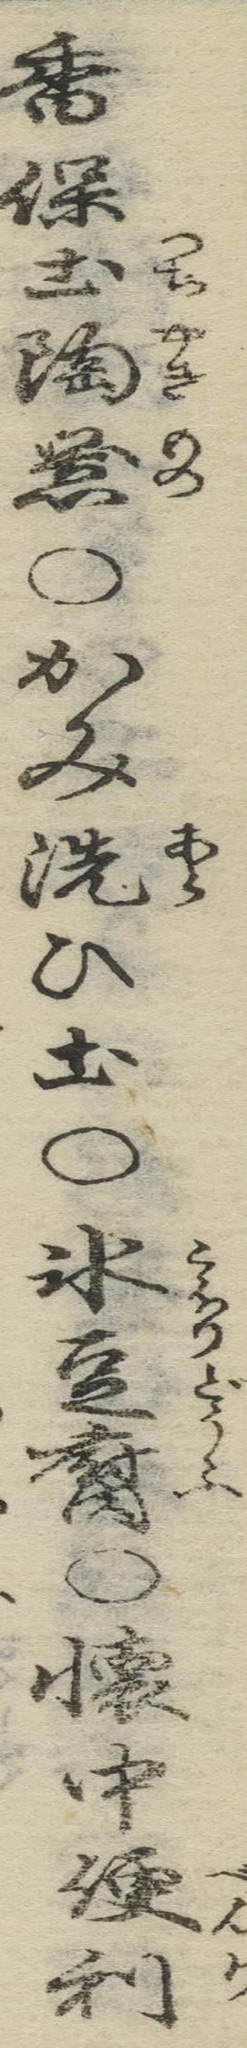香保土陶器○かみ洗ひ土○氷豆腐○懐中便利
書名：上州伊香保鑛泉圖會　全
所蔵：東京大学地震研究所図書室 Earthquake Research Institute Library, The University of Tokyo, JAPAN
